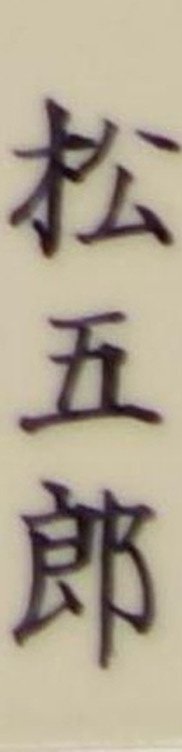松五郎
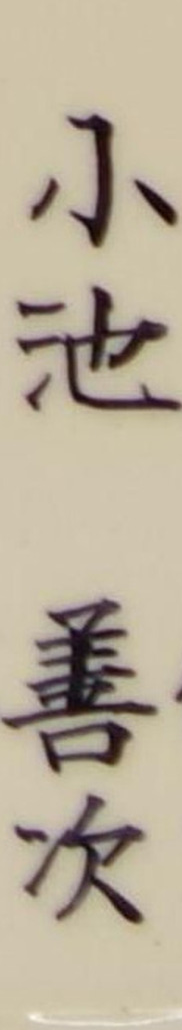小池善次
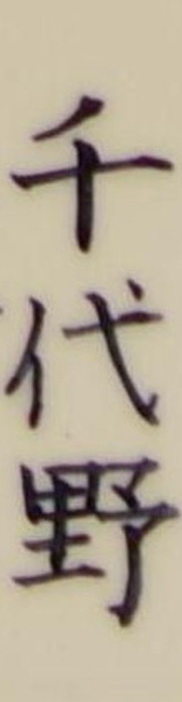千代野
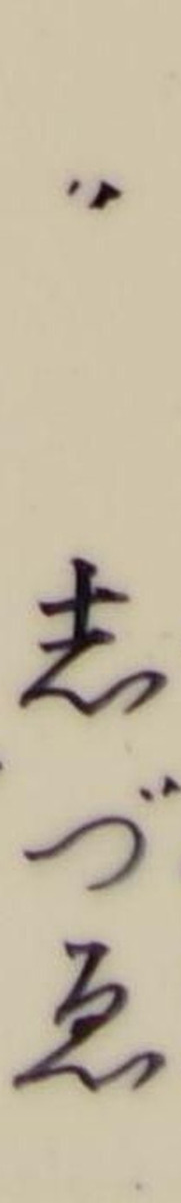しづゑ
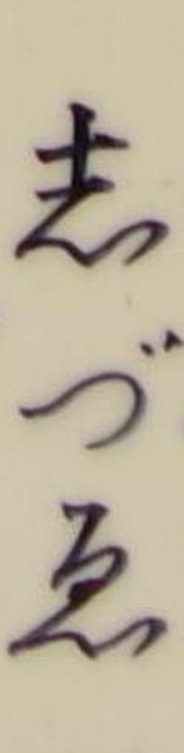しづゑ
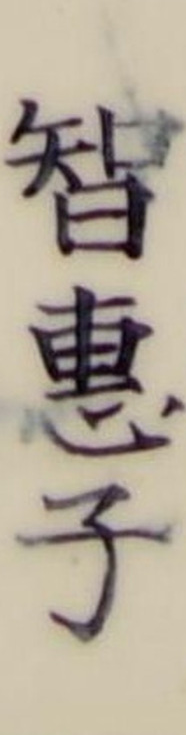智恵子
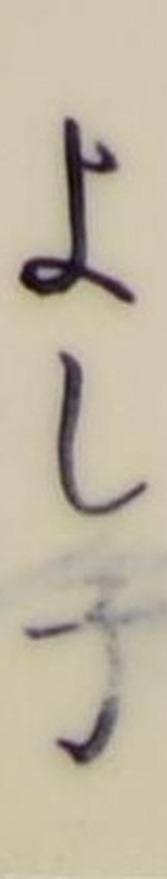よし子
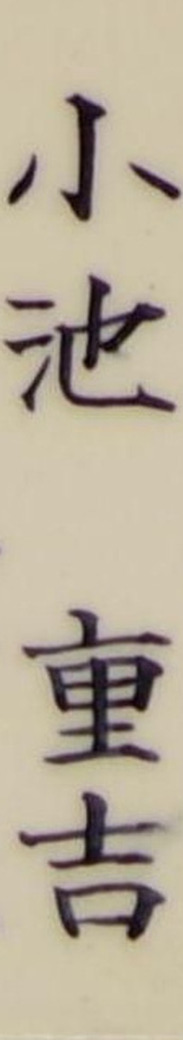小池重吉
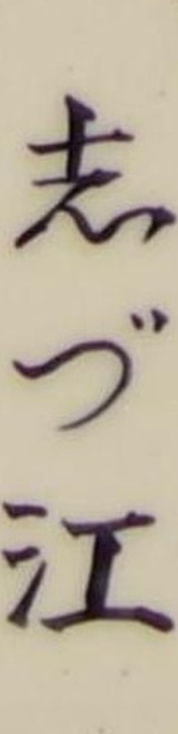しづ江
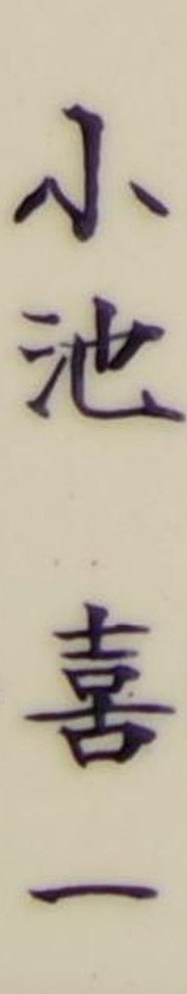小池喜一

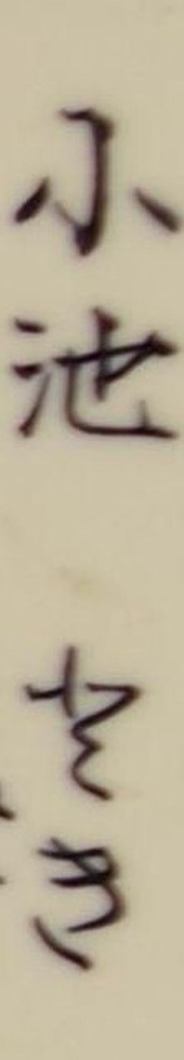小池とき
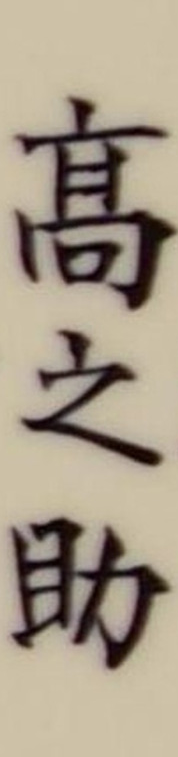高之助
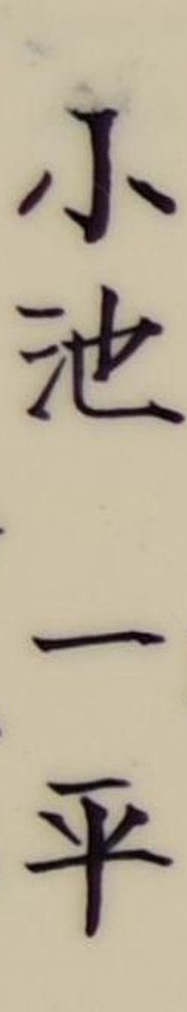小池一平
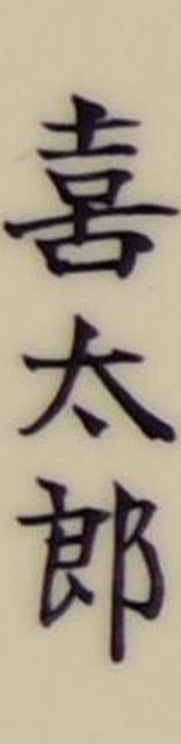喜太郎

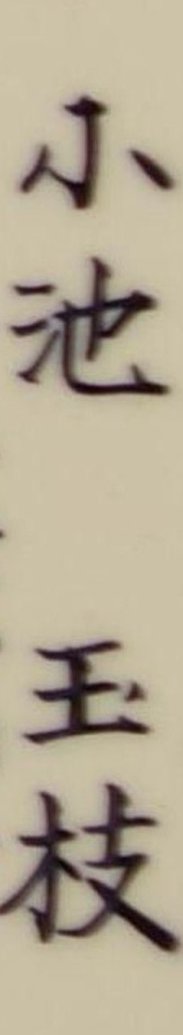小池玉枝
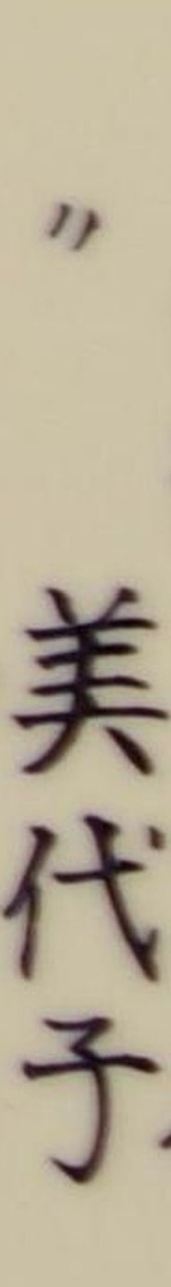美代子
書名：A~D
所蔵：koyasan kongobuji
